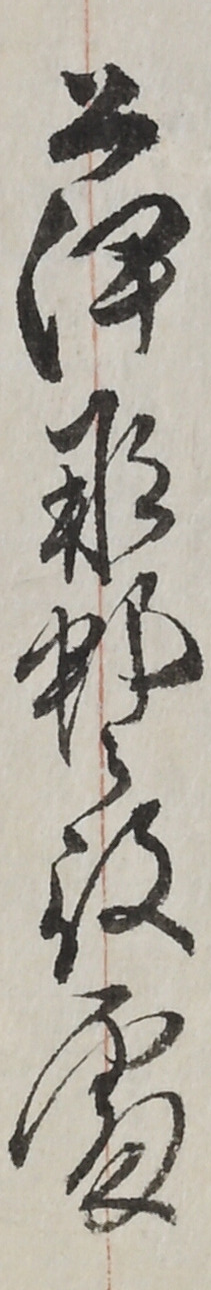上伊那邦之役処

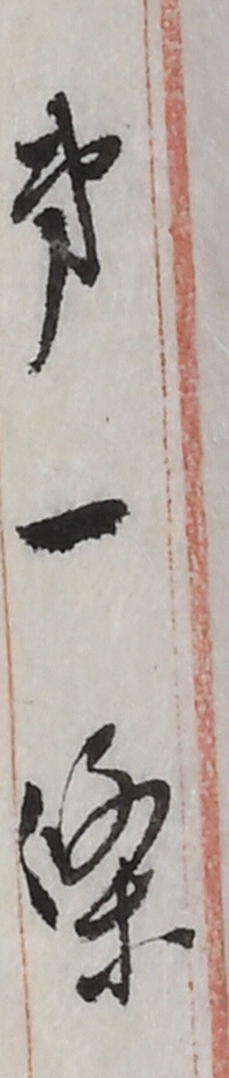第一条
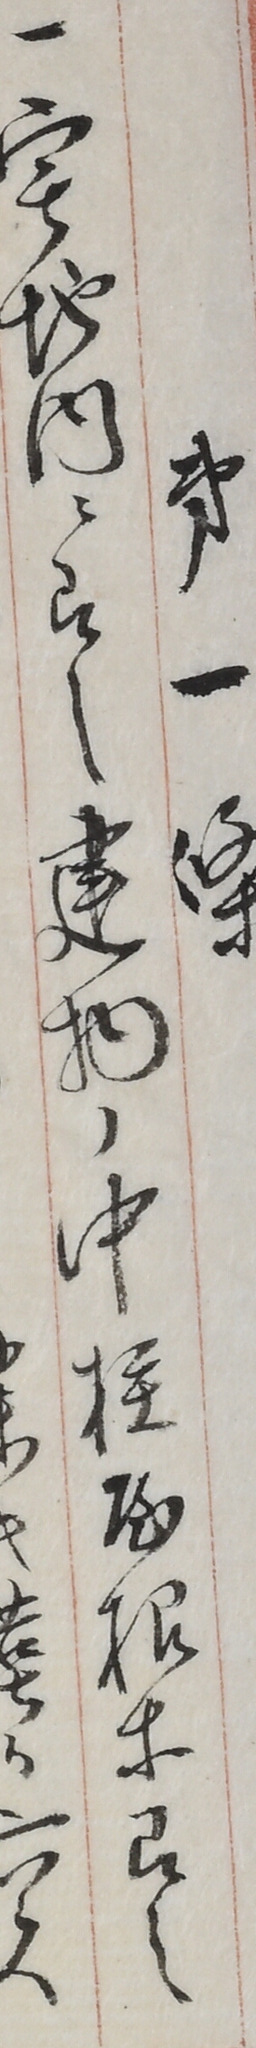一空地内に有之建物ノ中柱屋根等有之
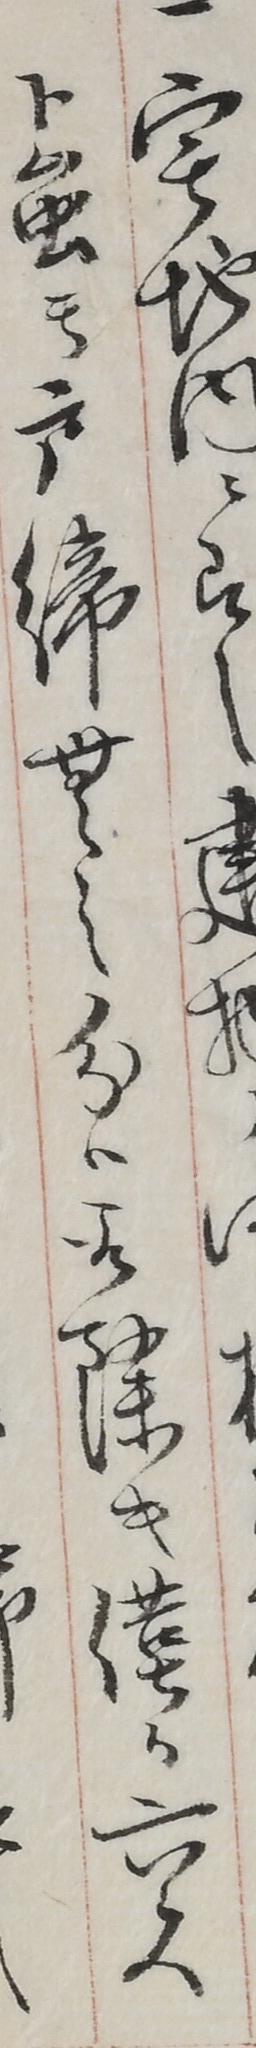ト雖モ戸締無之分ハ取除キ僅か六尺
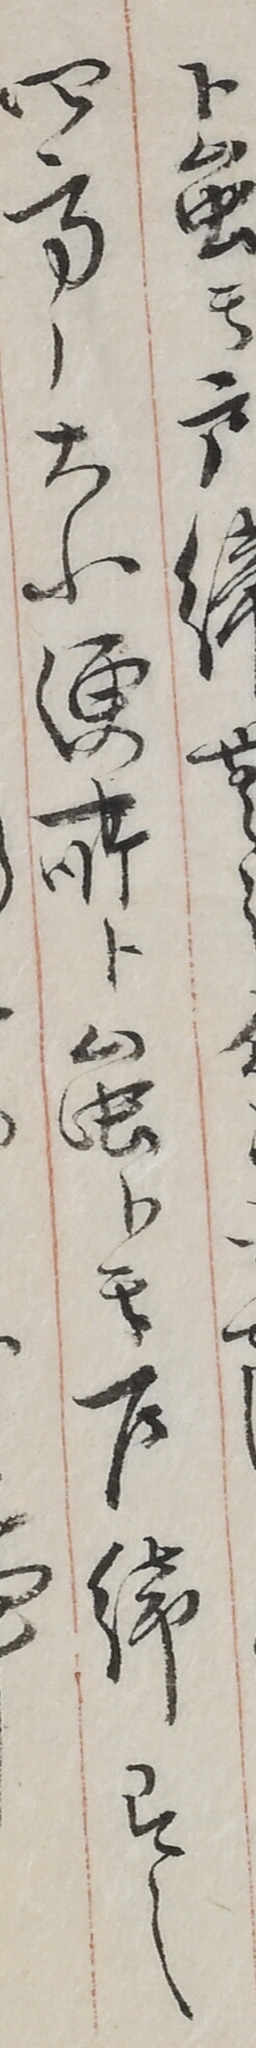四方ノ大小便所ト雖トモ取締有之
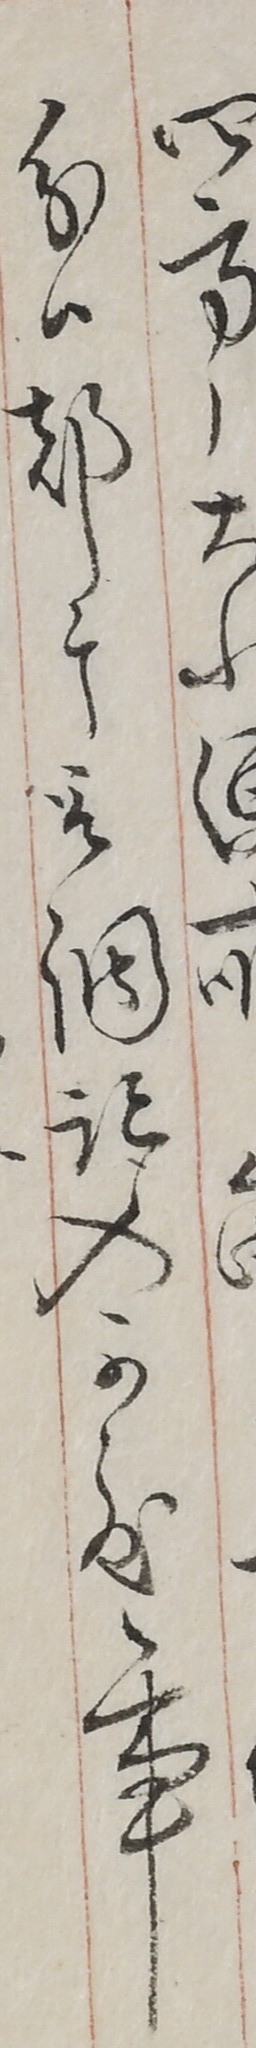分は都テ取調記入可致候事
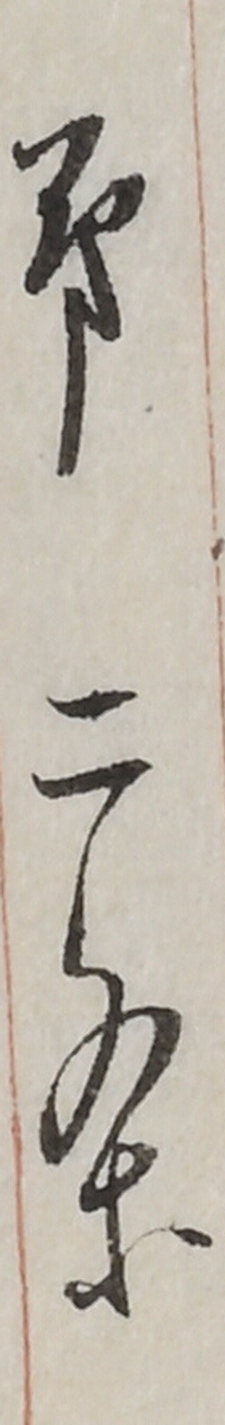第二条
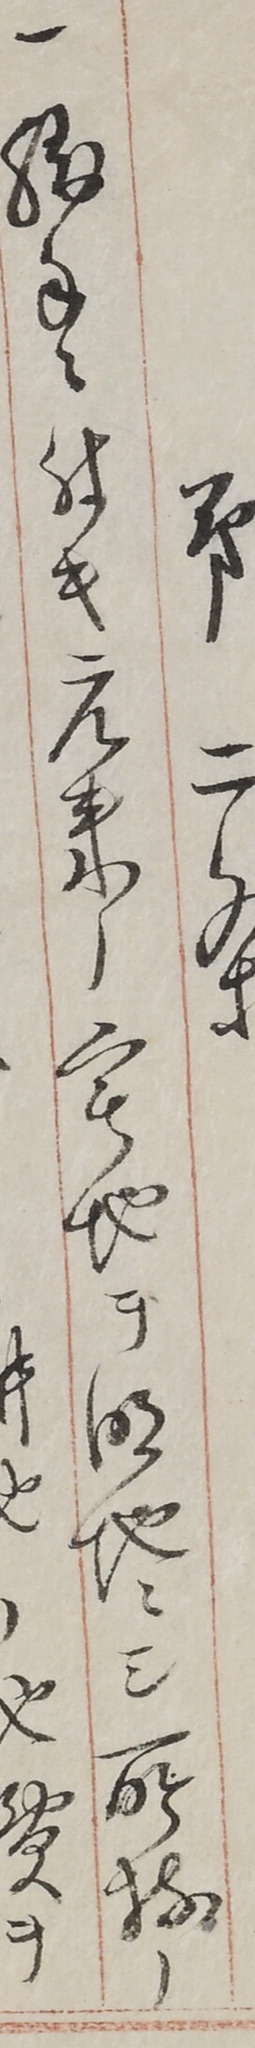一勝手ニ付キ元来ノ空地ヲ明地ニシ所特ノ
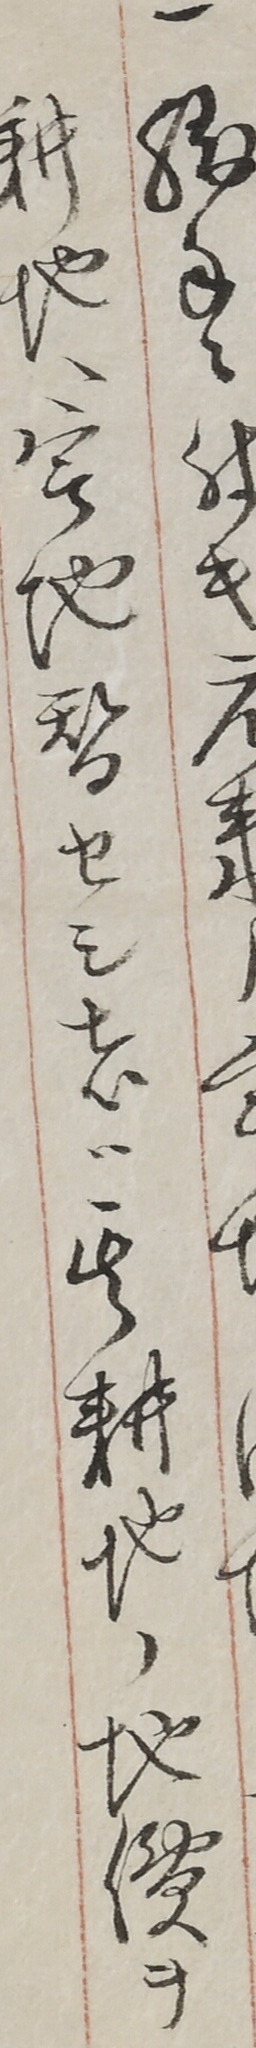耕地へ宅地替セシ者ハ其耕地ノ地価ヲ
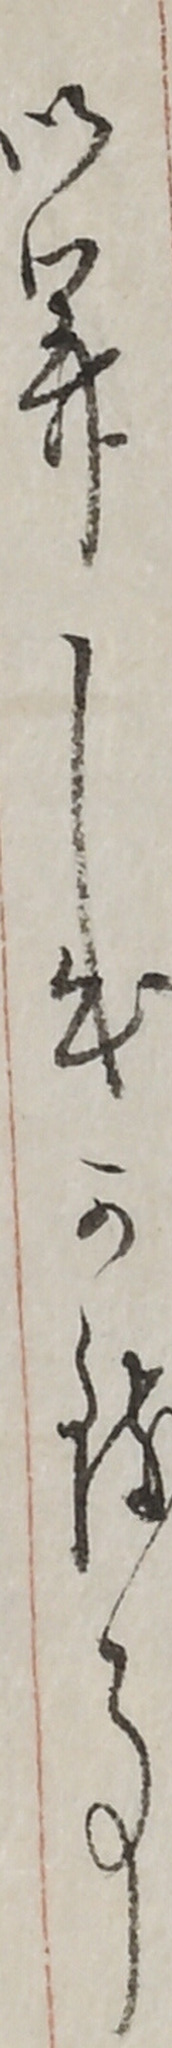以算し出可致事
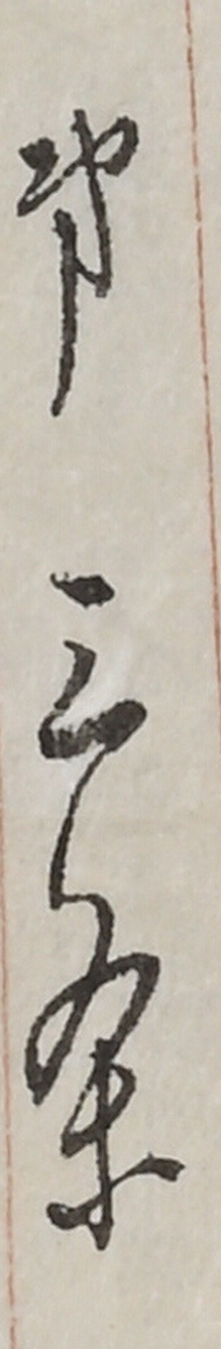第三条
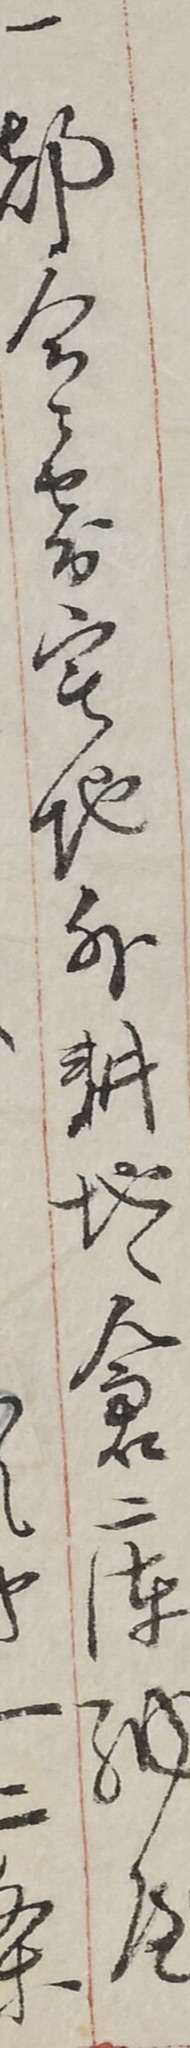一都合に寄宅地外耕地へ倉二庫納屋
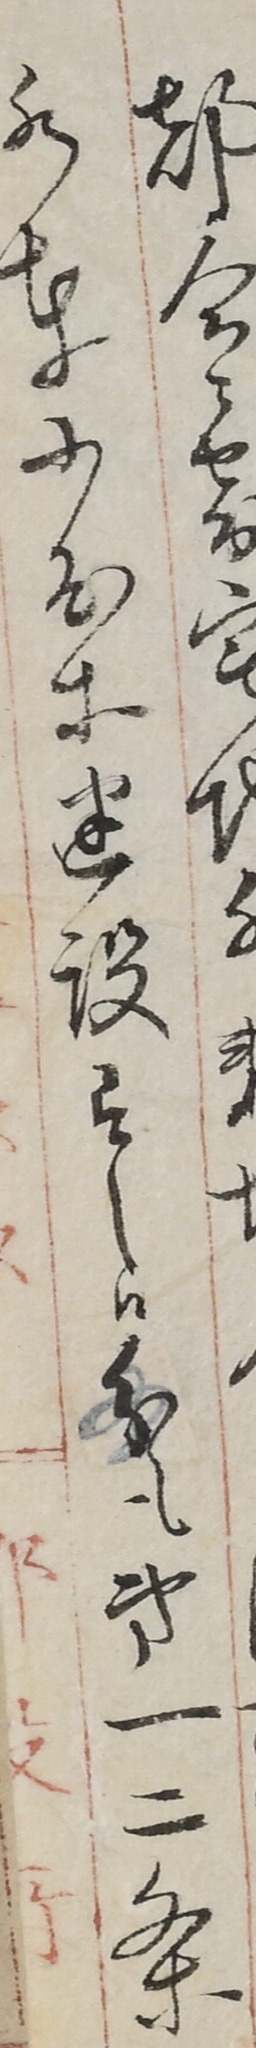水車小屋等建設有之候分も第一二条

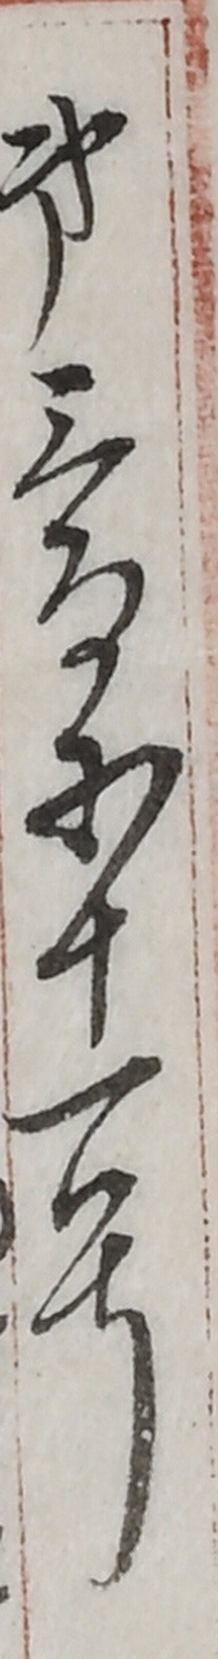第三百五十一号
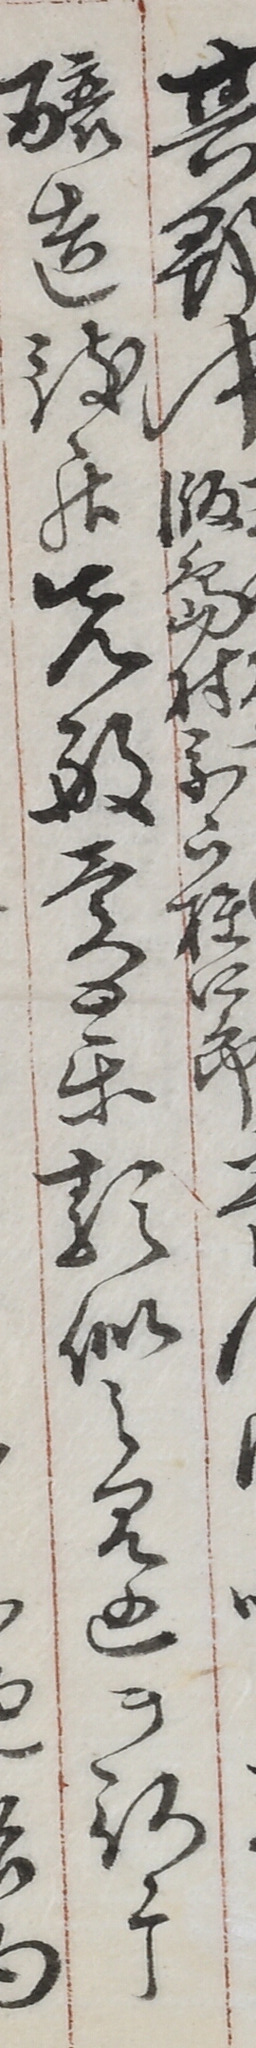醸造居之状先般売薬類似之見込ヲ行致候て
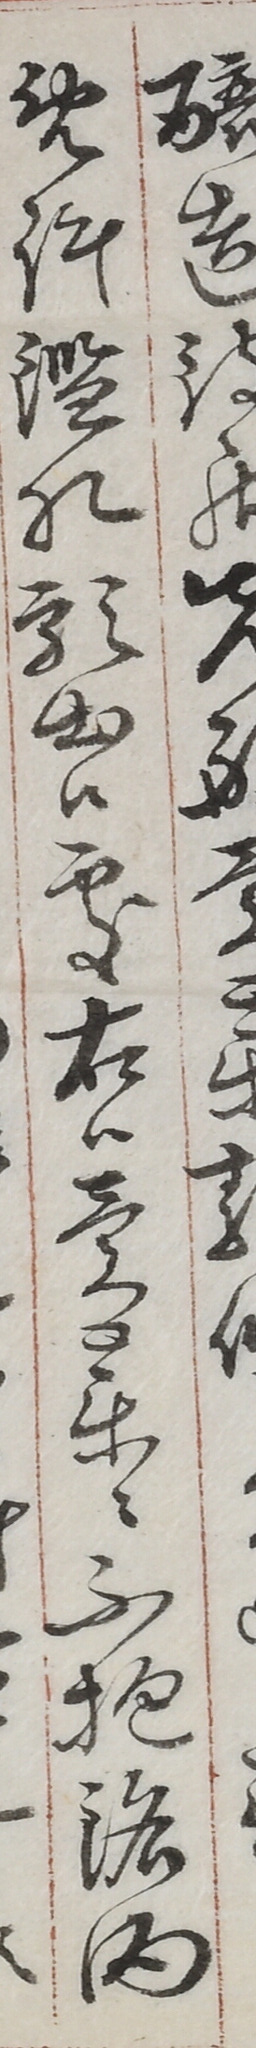免許鑑札願出候処右ハ売日売薬ニ不抱銘酒
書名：郡役所勤務中御用抜書
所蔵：伊那市立高遠町図書館・合同会社AMANE
